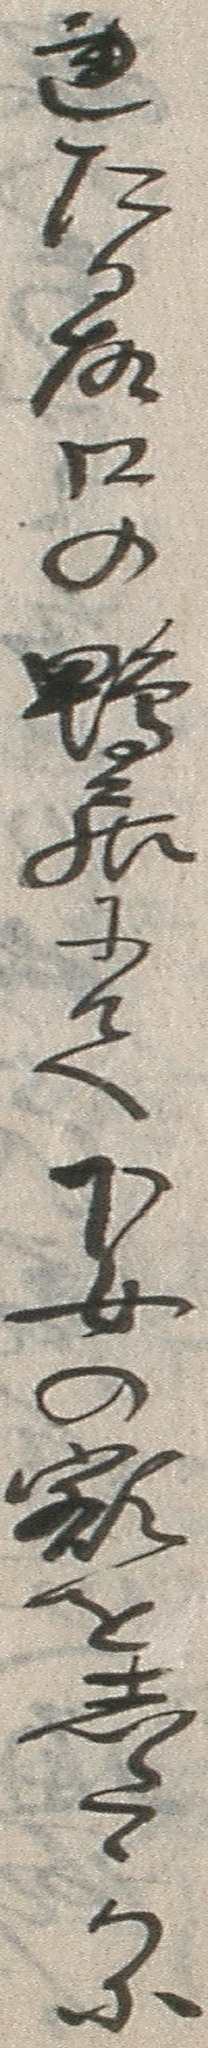れたる故口の鴨居にて下女の額をしたゝかに
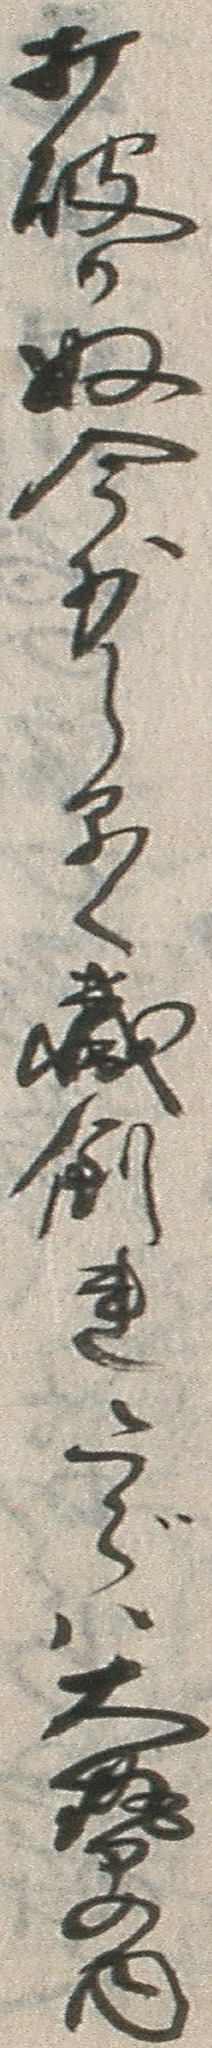打破りぬ今少し早く蔵倒れたらは大勢の内
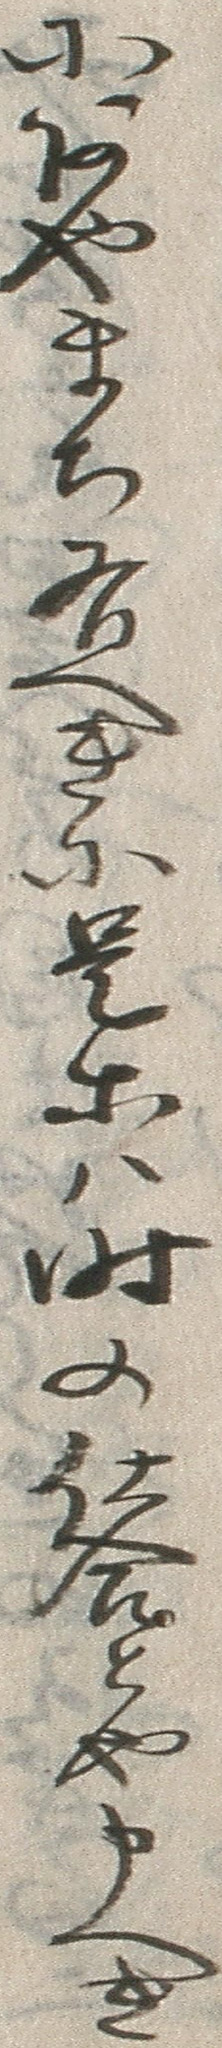にあやまち有へきに是等は時の仕合とや申へき
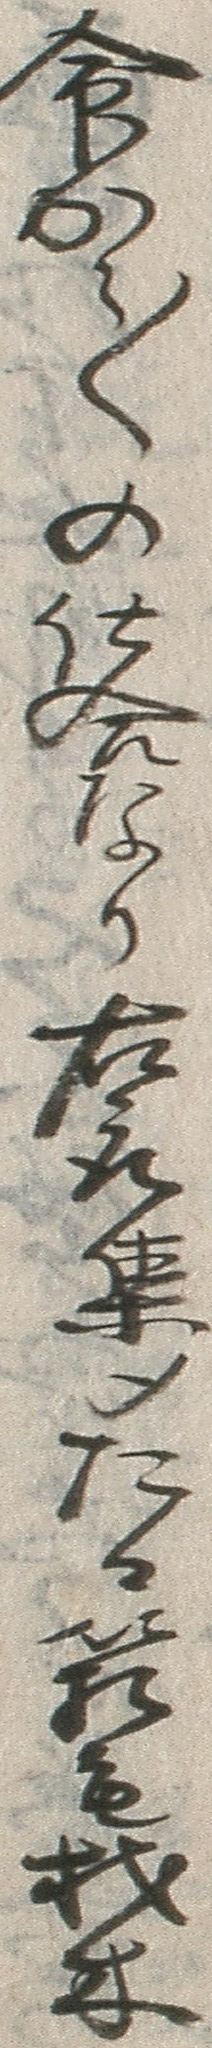命から〳〵の仕合なり右取集メたる箱も材木
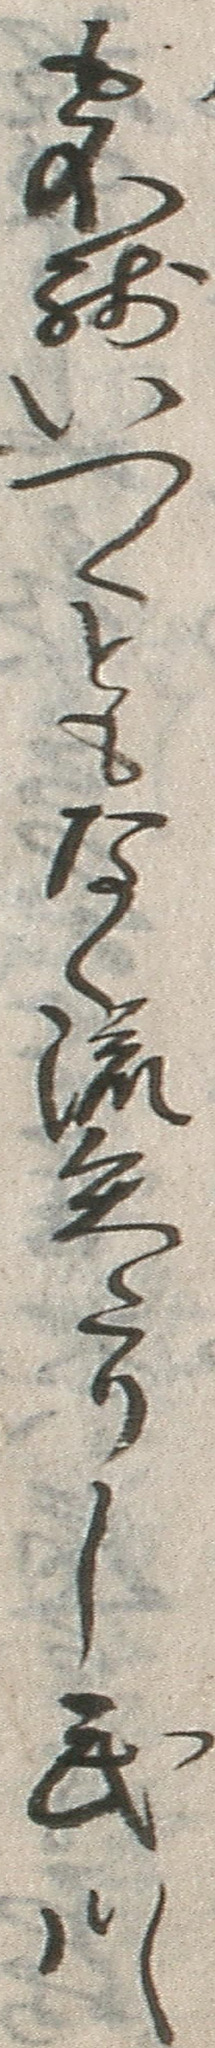も不残いつくともなく流失たりし民川
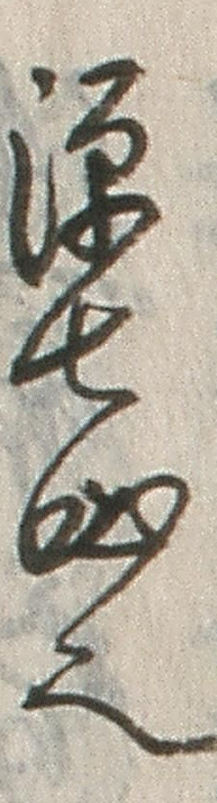源七咄也
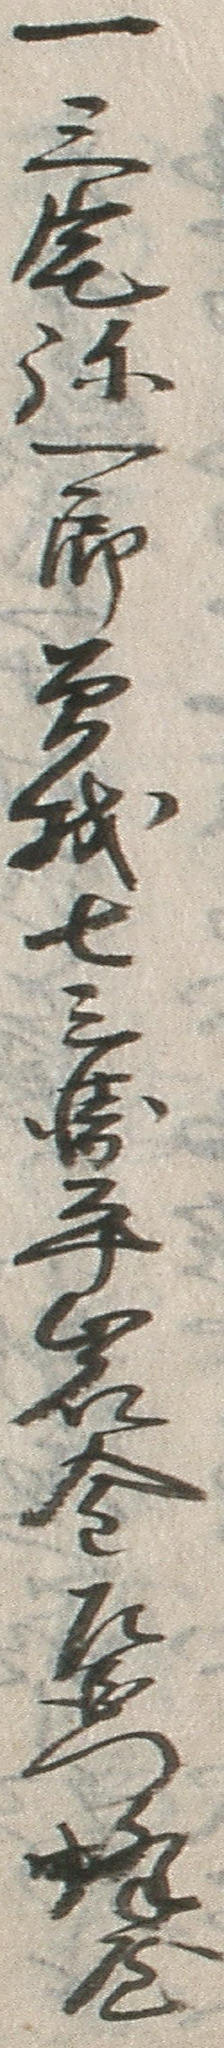一三宅弥一郎曽我七兵衛平岩全左衛門蜂屋
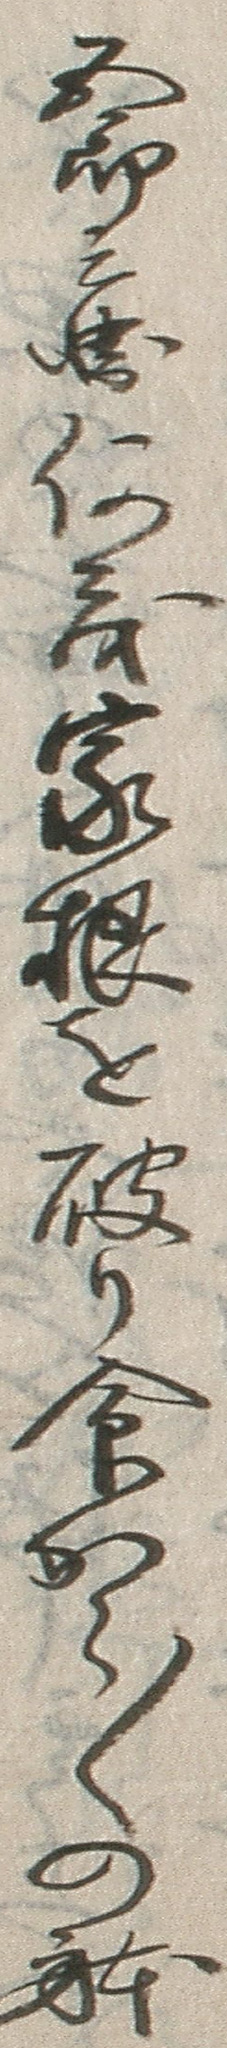五郎兵衛何も家根を破り命から〳〵の躰

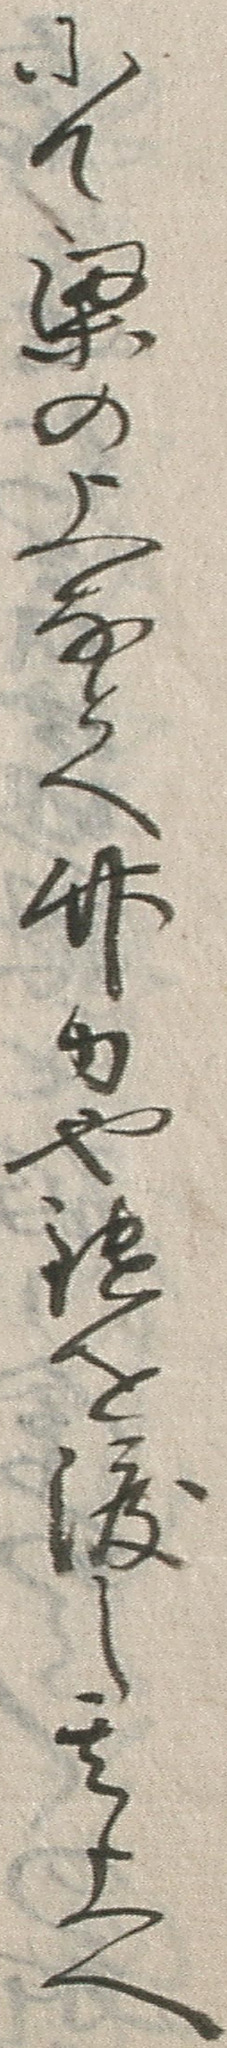にて梁の上なとへ竹刀や鑓を渡し其上へ
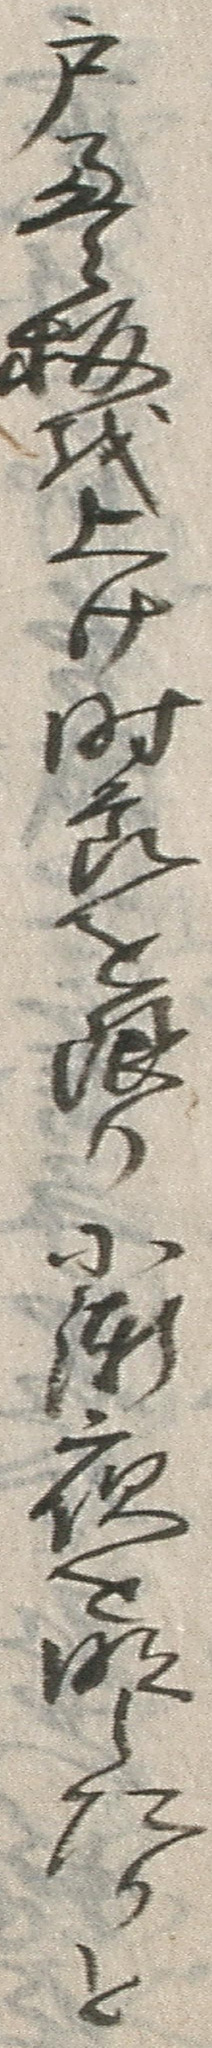戸畳板を上け時節を限りに漸夜を明したりと
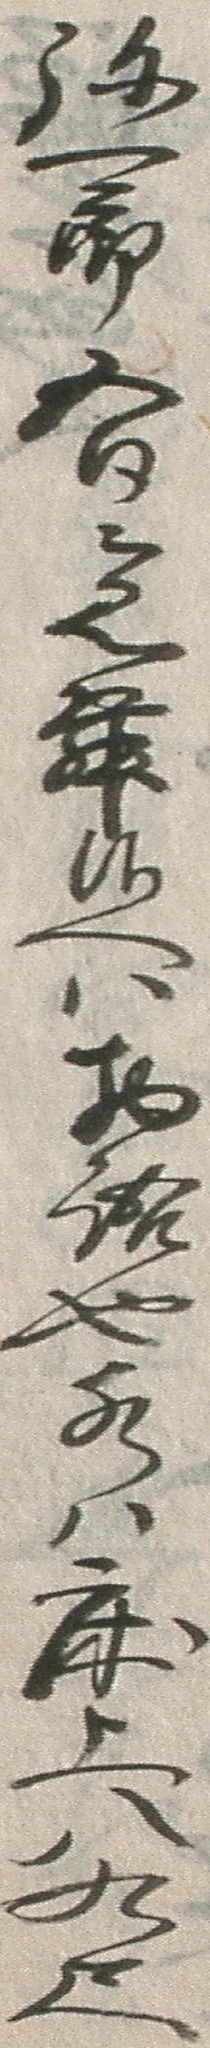弥一郎五月ニ見舞候ヘハ物語や水は床上八九尺
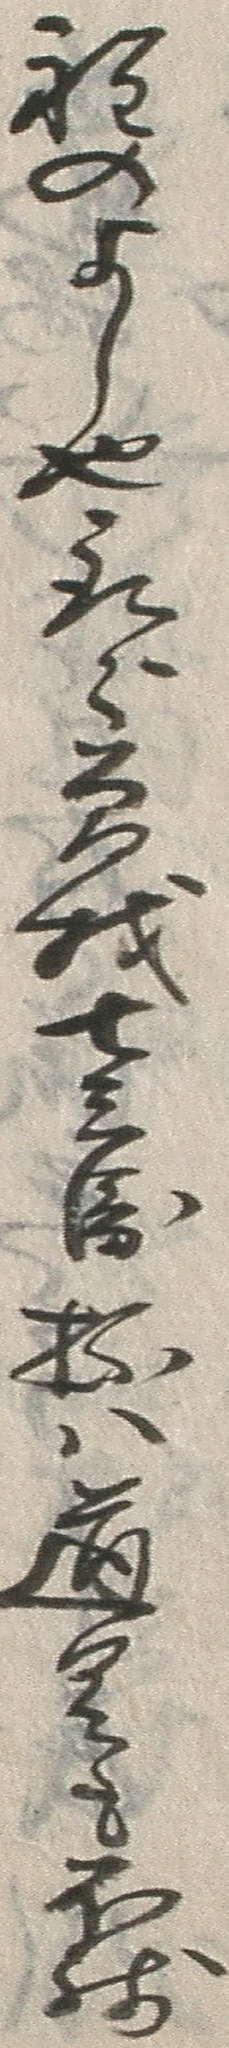程のよしや取分曽我七兵衛抔は道具も不残
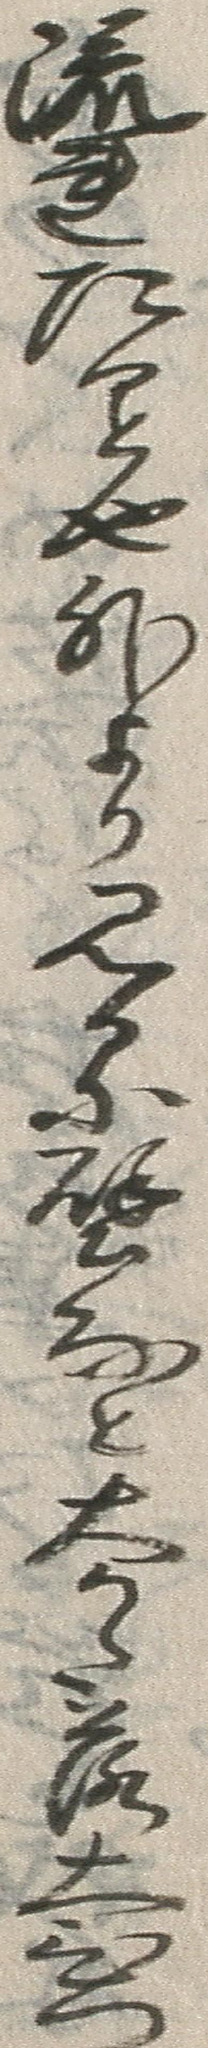流れたるとや外より見るに壁なと大かた落土ひつ
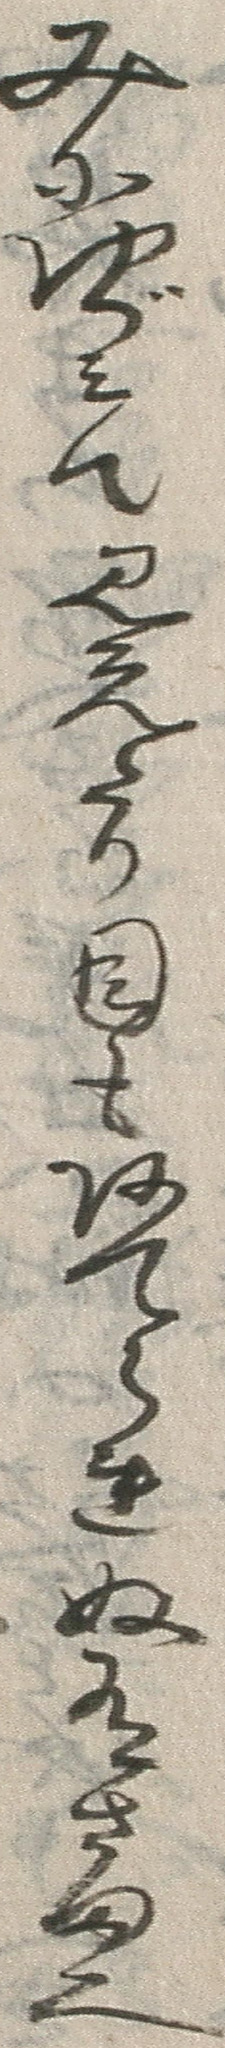みにゆがみて見えたり目もあてられぬ有さま也
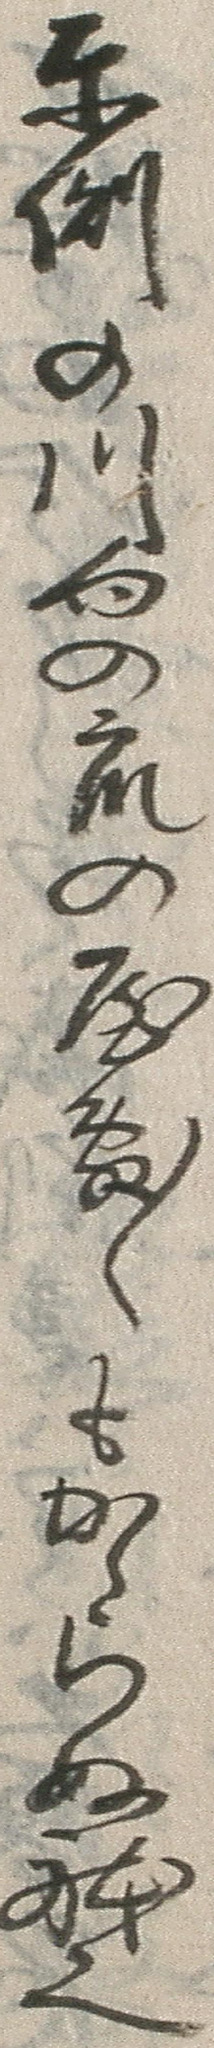東側の川向の衆の屋敷〳〵もかゝらぬ体也
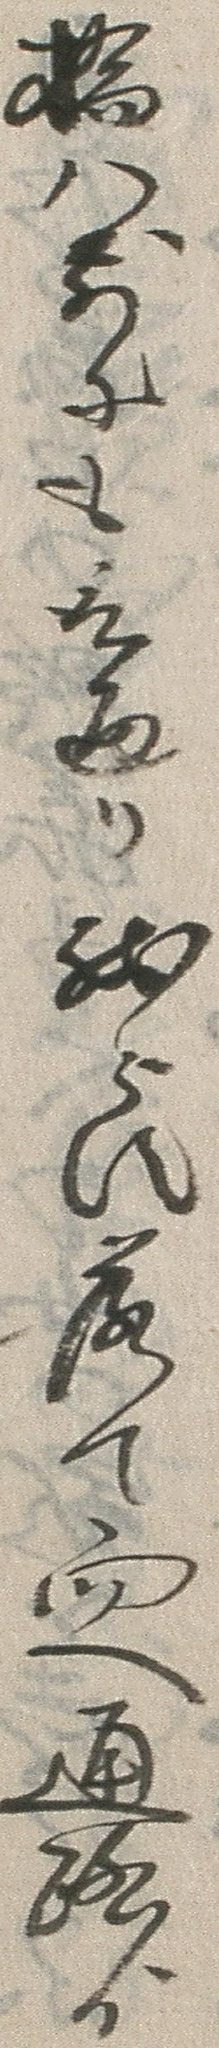橋は前にも取通り残らす落て向へ通路ゟ
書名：享保十三年江戸洪水記
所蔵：東京大学地震研究所図書室 Earthquake Research Institute Library, The University of Tokyo, JAPAN
